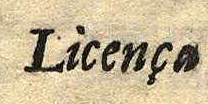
Licença
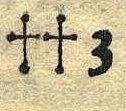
++3
